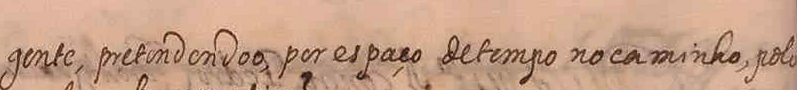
gente, pretendendoo, por espaço de tempo no caminho, polo
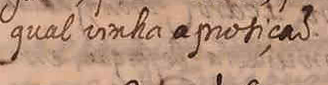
qual vinha a prosiçaõ
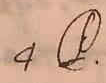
4 P.
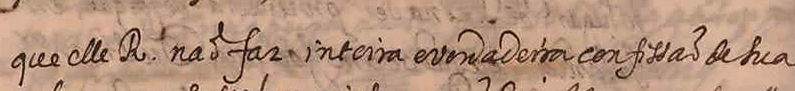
que elle R. naõ faz inteira e verdadeira confissaõ de sua
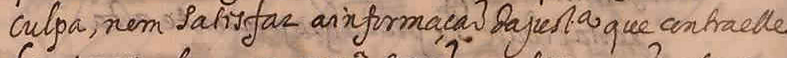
culpa, nem satisfaz a informaçaõ da justa que contra elle
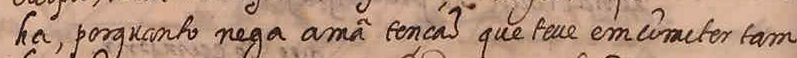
ha, porquanto nega a má tençaõ que teue em cōmeter tam
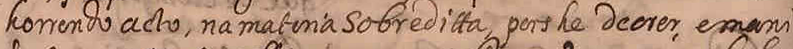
horrendo acto, na materia Sobreditta, pois he de crer, e mani
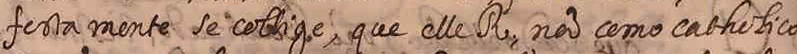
festamente se collige, que elle R, naõ como catholico
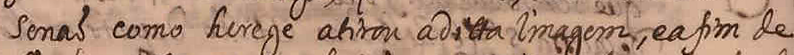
senaõ como herege atirou a ditta Imagem, e a fim de
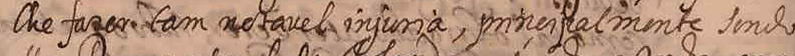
lhe fazer tam notauel injuria, prinçipalmente sendo
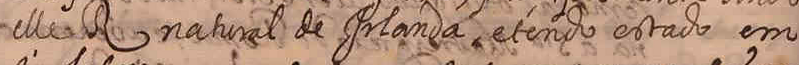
elle R natural de Jrlanda, e tendo estado em
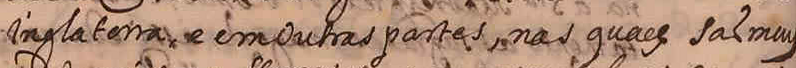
Inglaterra, e em outras partes, nas quaes saõ muy
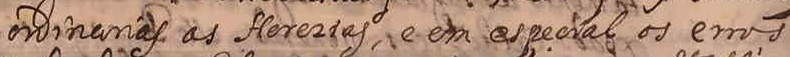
ordinarias as Herezias, e em especial os erros
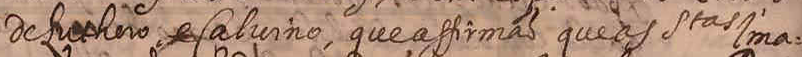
de Luthero, e Caluino, que affirmaõ que as Stas Ima
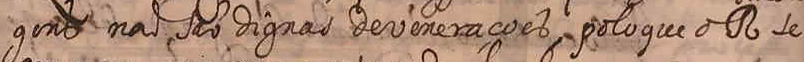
gens naõ saõ dignas de veneraçoẽs, polo que o R se
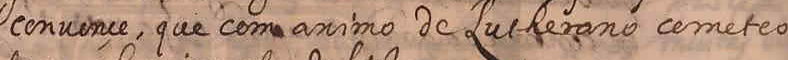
conuençe, que com animo de Lutherano cometeo
